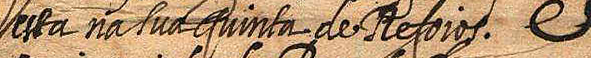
esta na sua quinta de Refoios. &
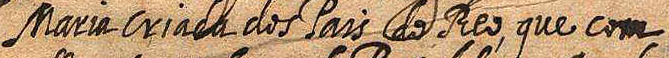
Maria criada dos Pais do Reo, que com
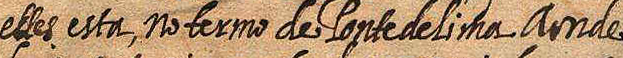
elles esta, no termo de Ponte de Lima aonde
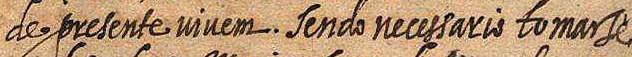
de presente uiuem. sendo necessario tomarse
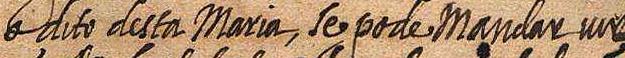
o dito desta Maria, se pode Mandar uir
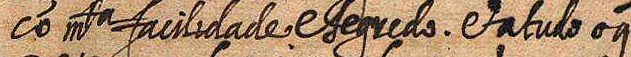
cō mta facilidade e segredo. & a tudo o q̄
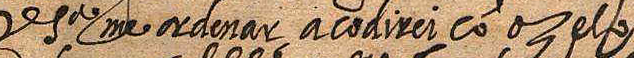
V Sa me ordenar, acodirei cō o zelo
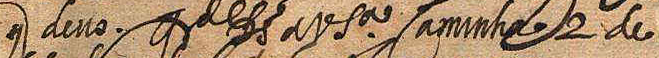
q̄ deuo. Ḡde Ds̄ a V S.a Caminha 2 de
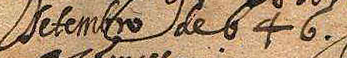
Setembro de 646.
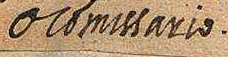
O cōmissario.
